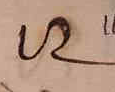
12
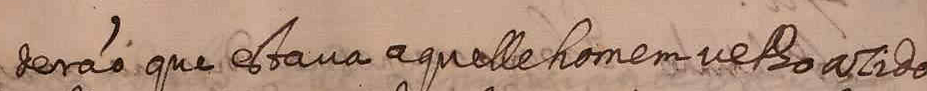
deraõ que estaua aquelle homem uelho azido
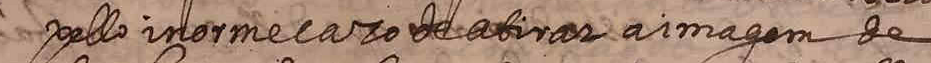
pello inorme cazo de atirar a imagem de
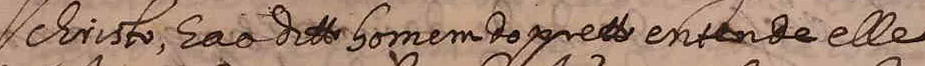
christo, E ao ditto homem do pretto entende elle
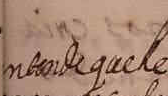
ntende que he
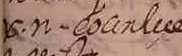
x. n. e o conheçe
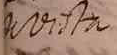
de vista
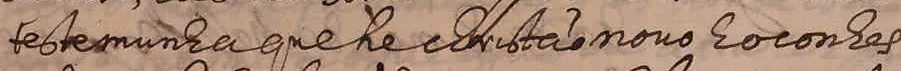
testemunha que he christaõ nouo E o conhes
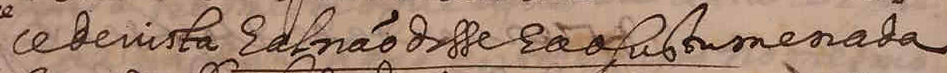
ce de uista E al naõ disse E ao Custume nada
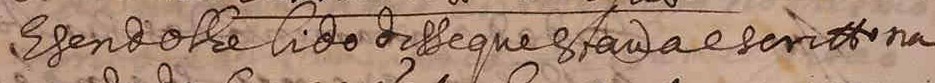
E sendolhe lido disse que estaua escritto na
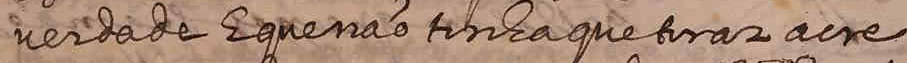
uerdade E que naõ tinha que tirar a cre
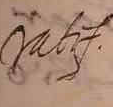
ratif.
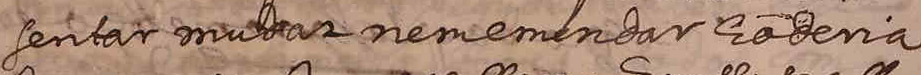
sentar mudar nem emendar E o desia
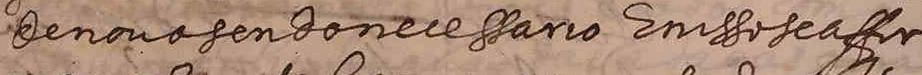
de nouo sendo necessario E nisso se affir
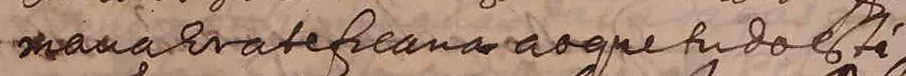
maua e rateficaua ao que tudo esti
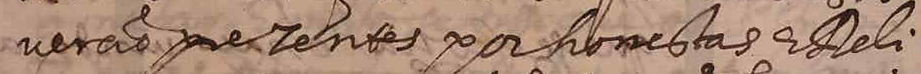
ueraõ prezentes por honestas E Reli
